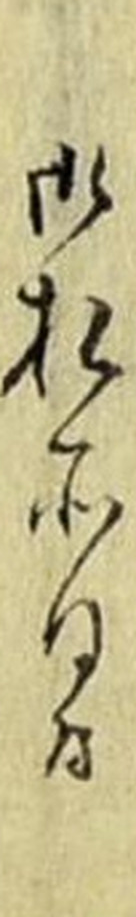御札所目付
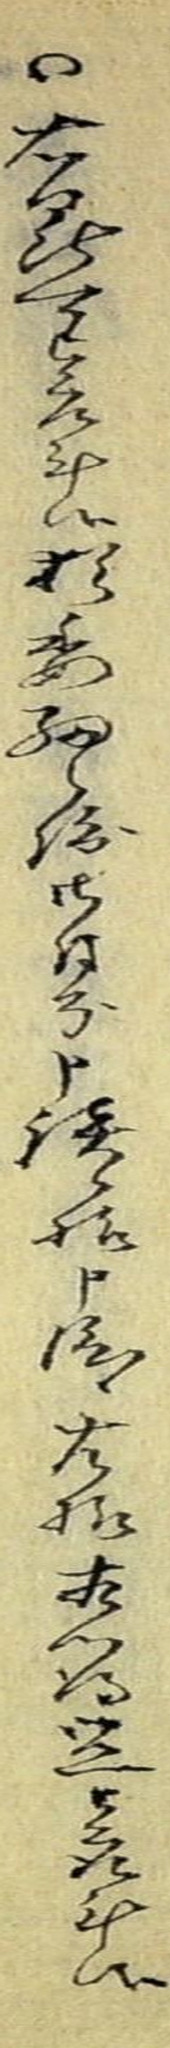○右同断可被取斗候猶委細之儀御自分申談候様申渡候左様相心得宜被取斗候
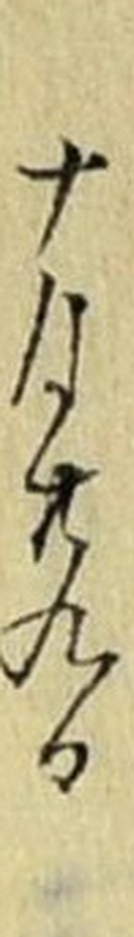十月廿九日
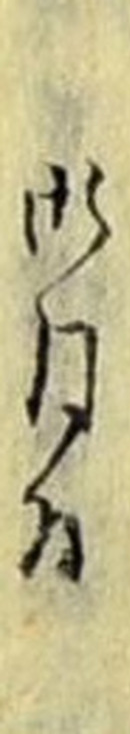御目付
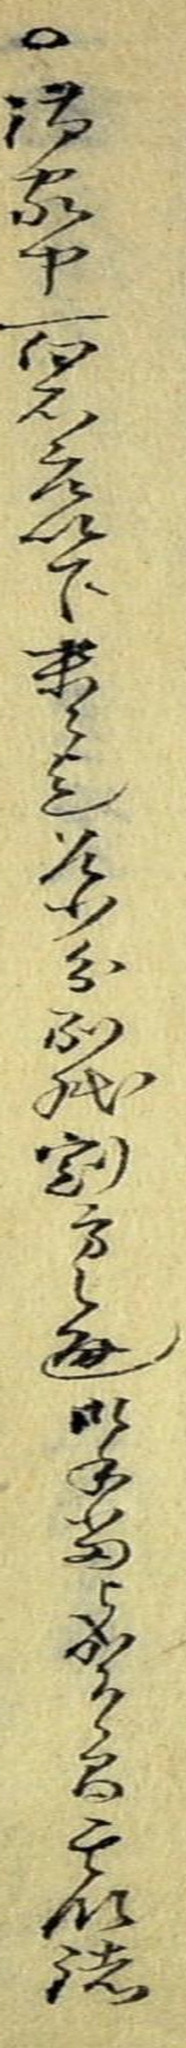○御家中百石取以可末々迄乍少分別紙割方之通御手当被成下候間其段諸
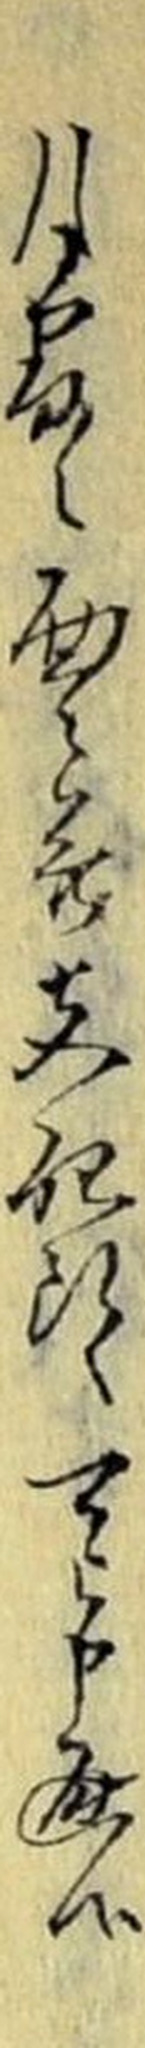月番之面々并支配頭へ可被申通候

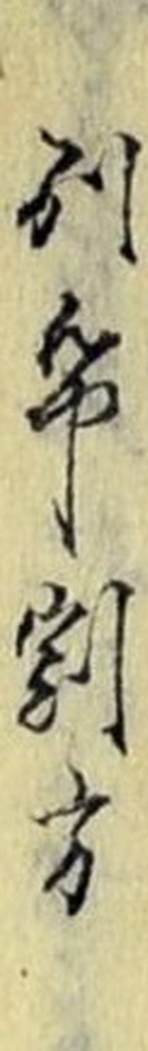別紙割方
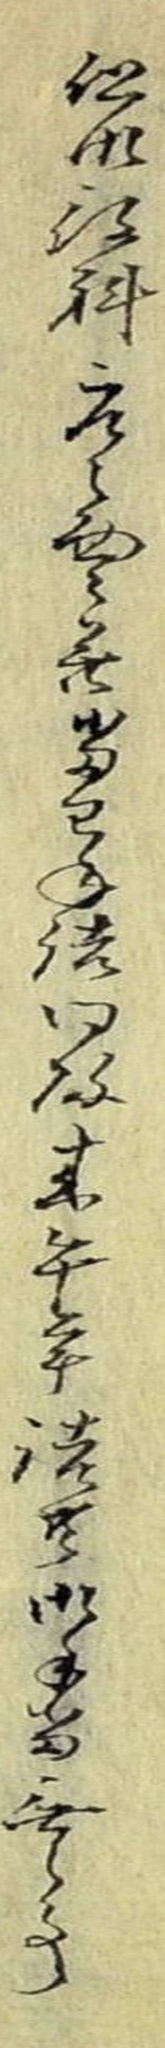但御役料取之面々并当巳年詰同移来午年詰共へ御手当無之事
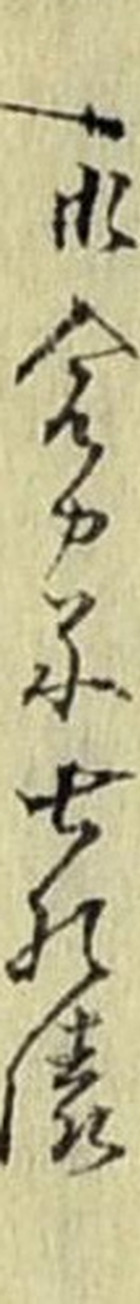御合力米七拾俵
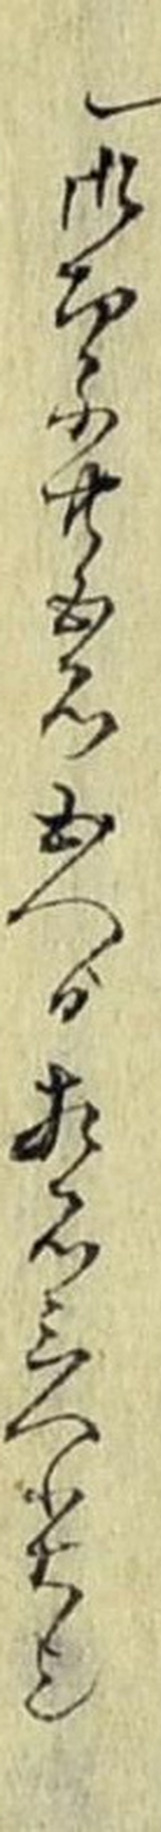御切米廿五石五人ゟ拾石三人ふち迄
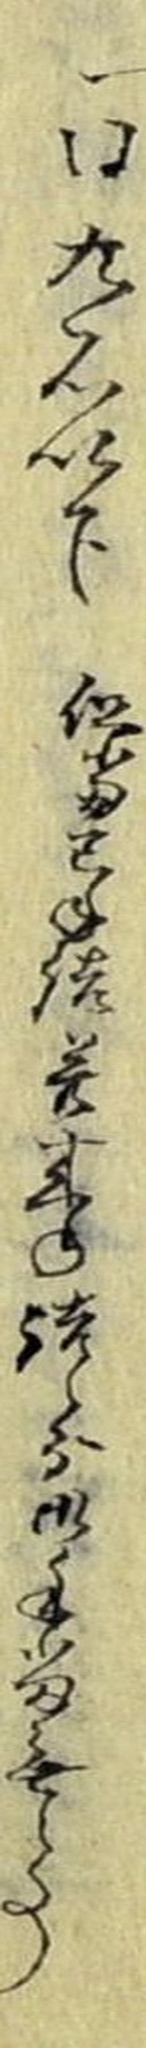同九石以下但当巳年詰并来年詰候分御手当無之事
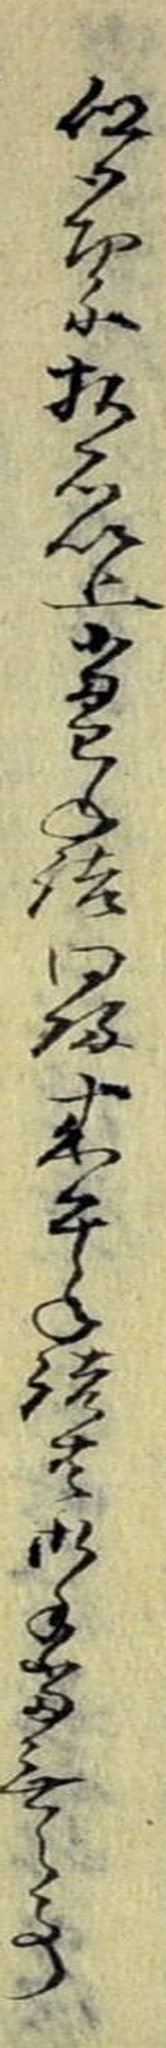但御切米拾石以上当巳年詰同移来午年詰共御手当無之事
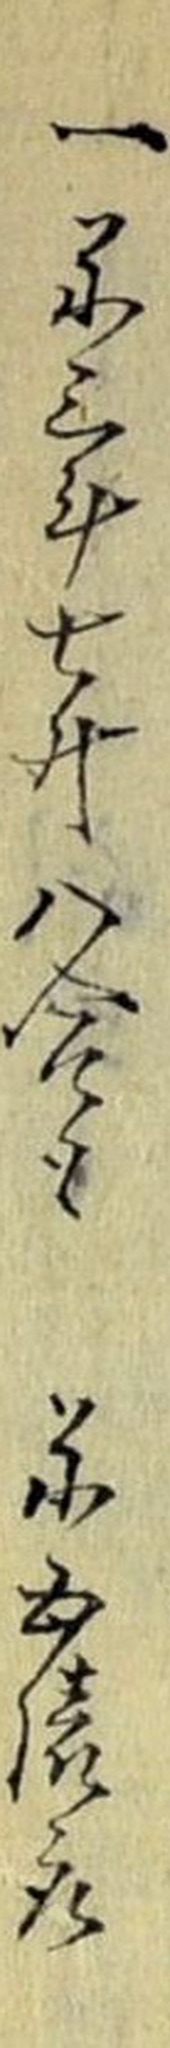一米三斗七升八合つヽ米五俵取
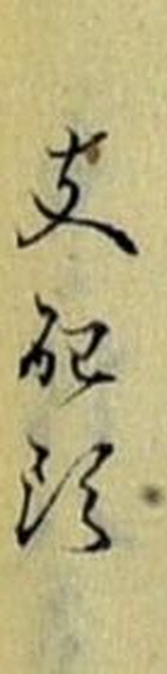支配頭
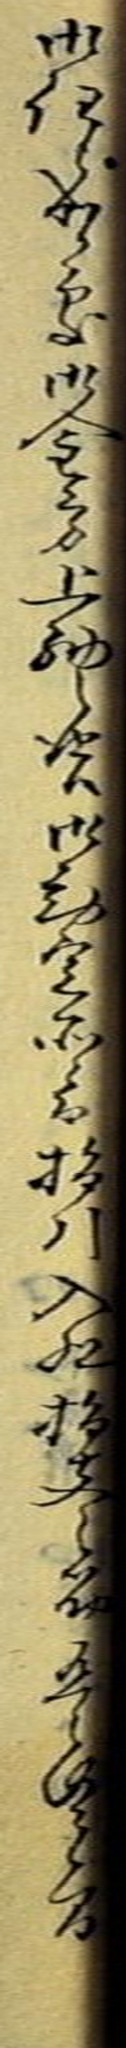御任被成候処御金方上納之儀は御勘定所に而指引入組指支之筋有之趣に候間
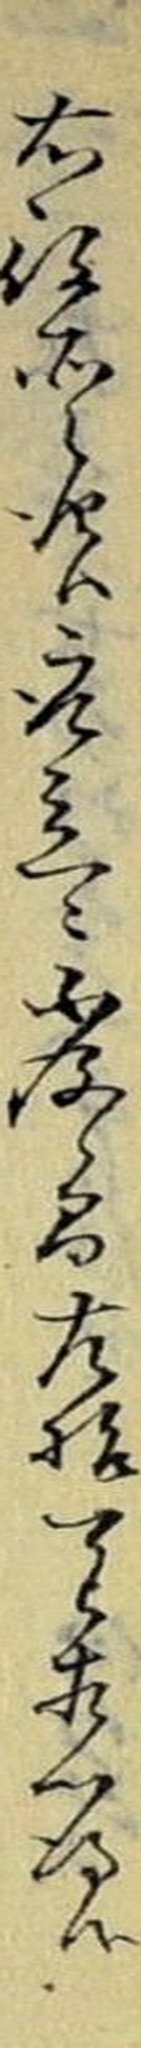右役所之儀は取立に不及候間左様可被相心得候
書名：命令之部 六
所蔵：福井県文書館 Fukui Prefectural Archives
